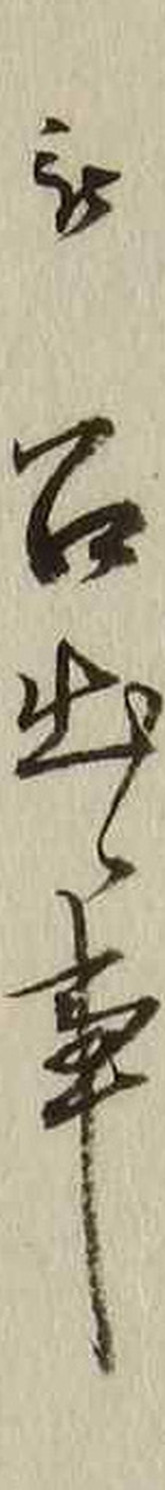被召出候事
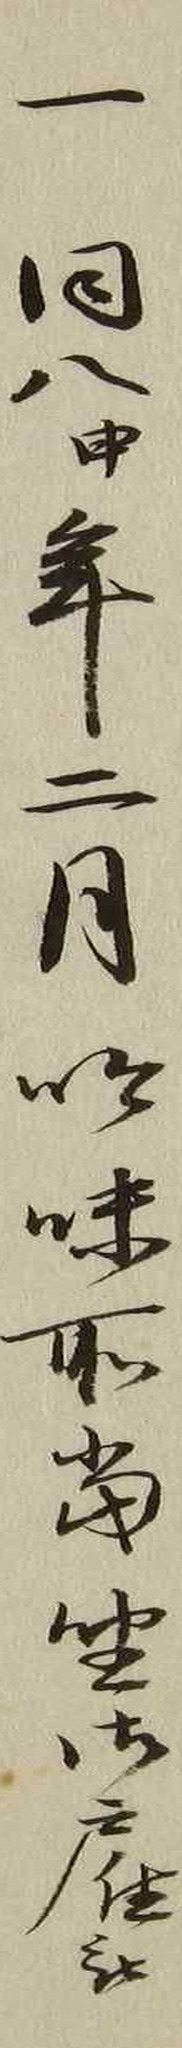一同八申年二月吟味所当坐御雇被
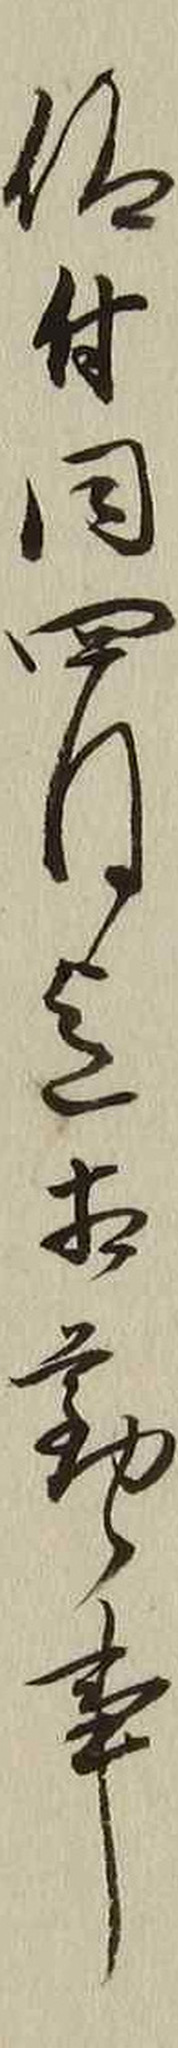仰付同四月迄相勤候事
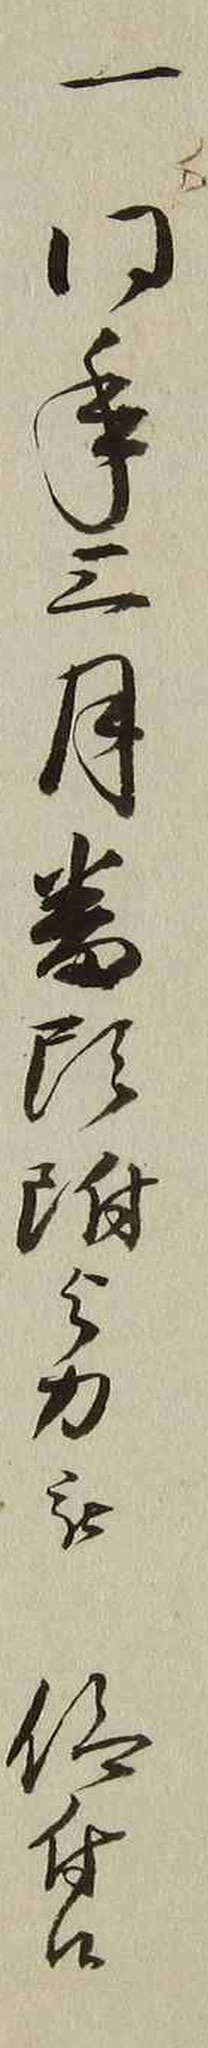一同年三月番頭附与力被仰付候
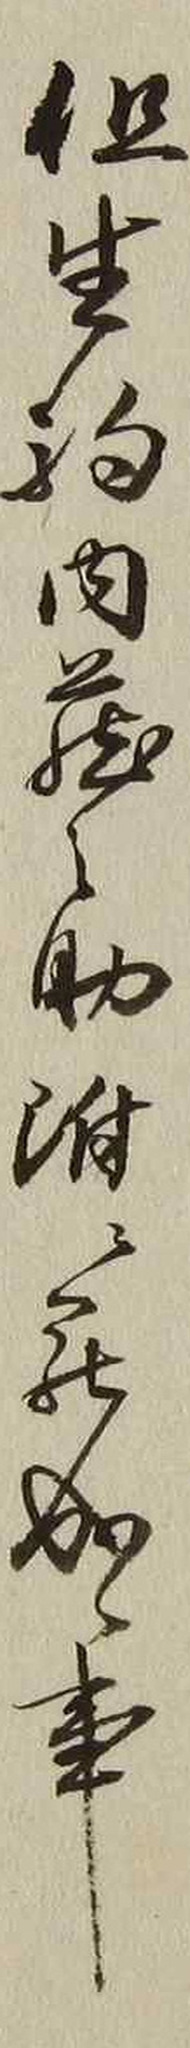但生駒内蔵之助附ニ罷成候事
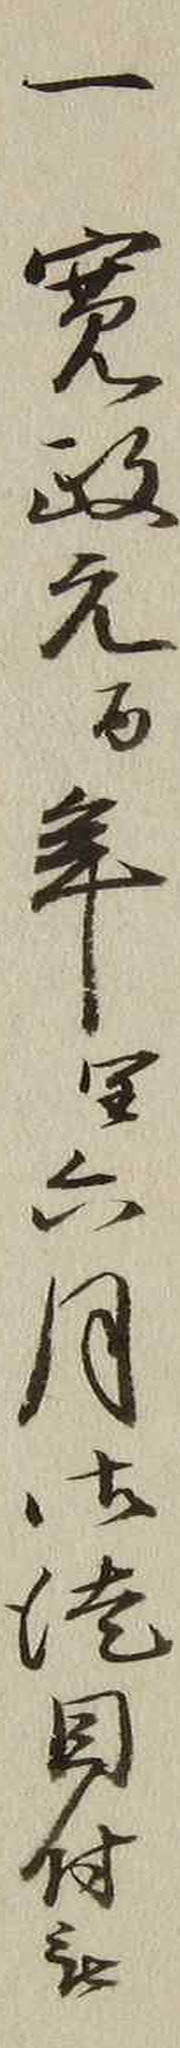一寛政元酉年閏六月御徒目付被
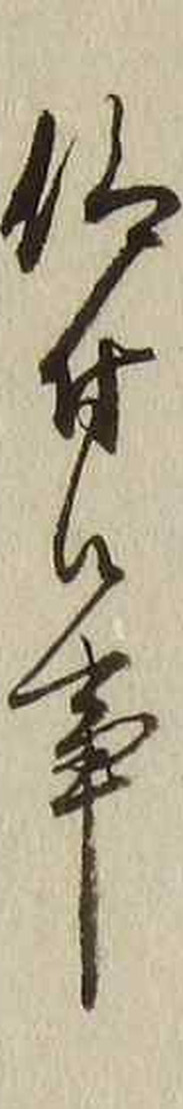仰付候事
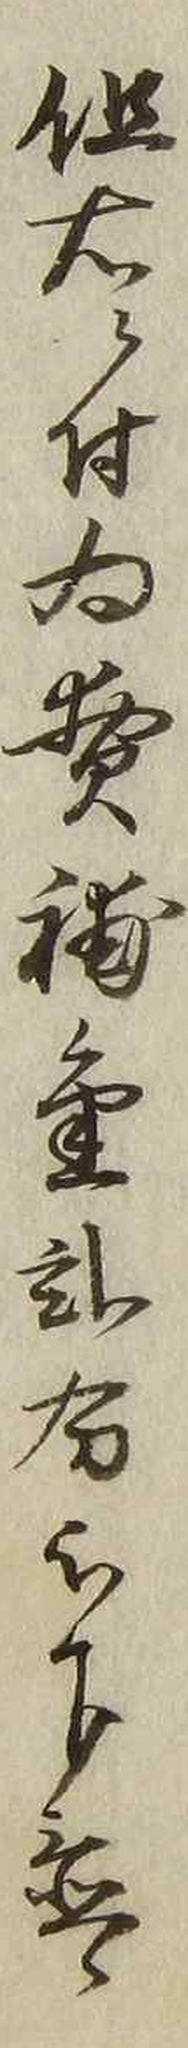但右ニ付為費補金弐分被下置候
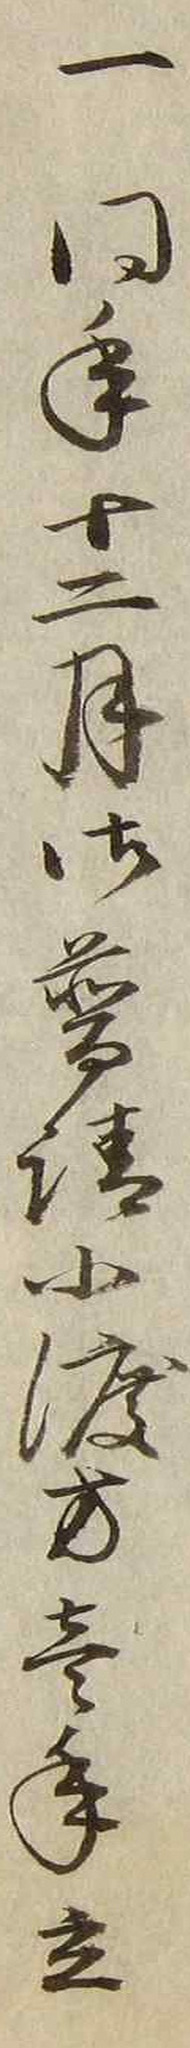一同年十二月御普請小渡方壱年立
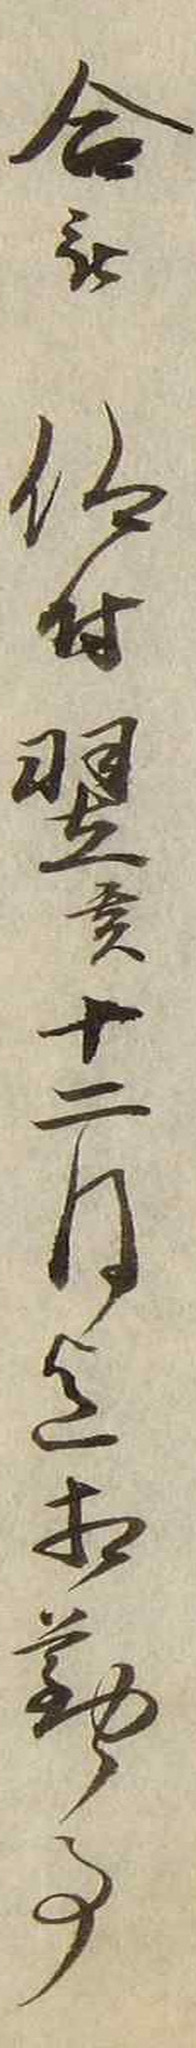合被仰付翌亥十二月迄相勤候事

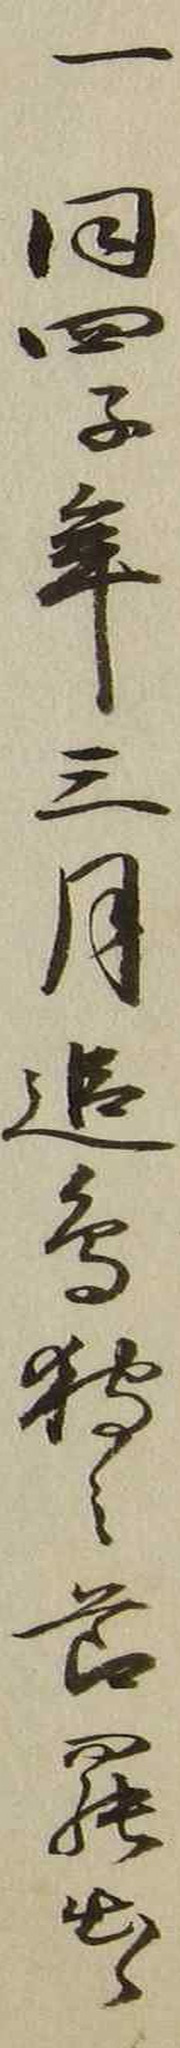一同四子年三月追鳥狩之節罷出候
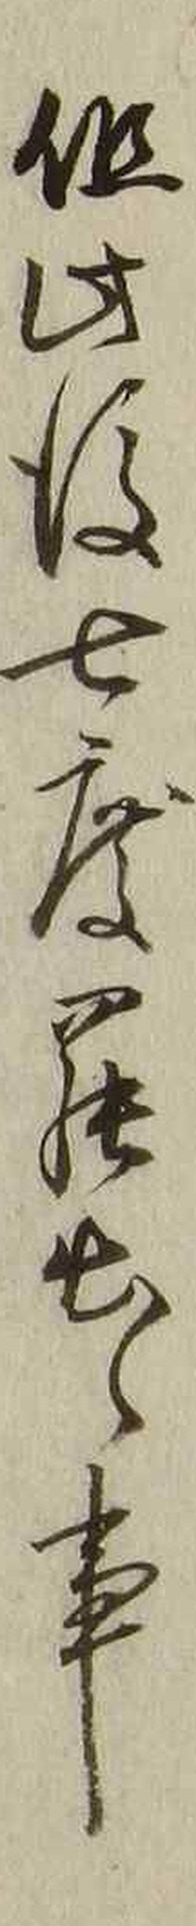但此後七度罷出候事
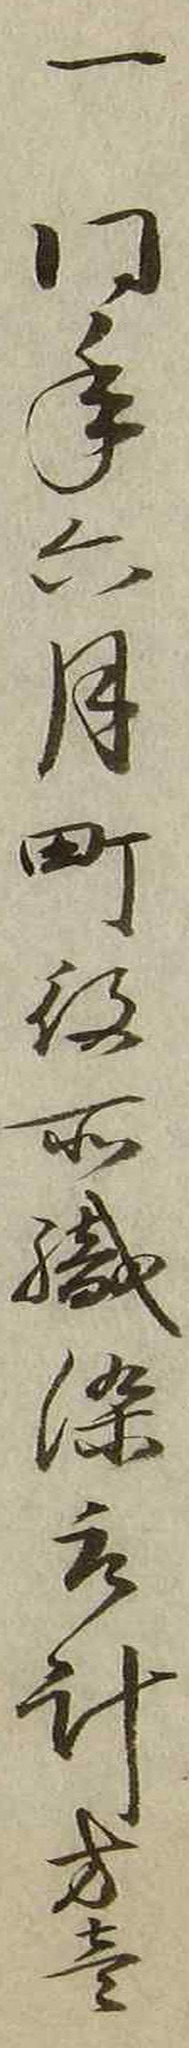一同年六月町役所織染取計方壱
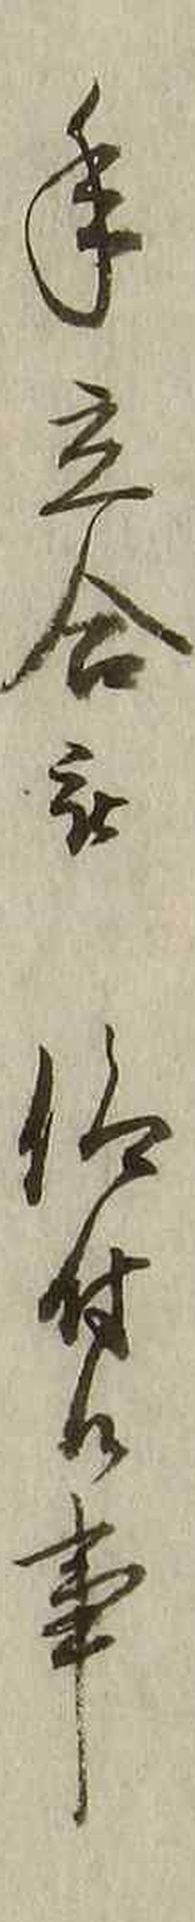年立合被仰付候事
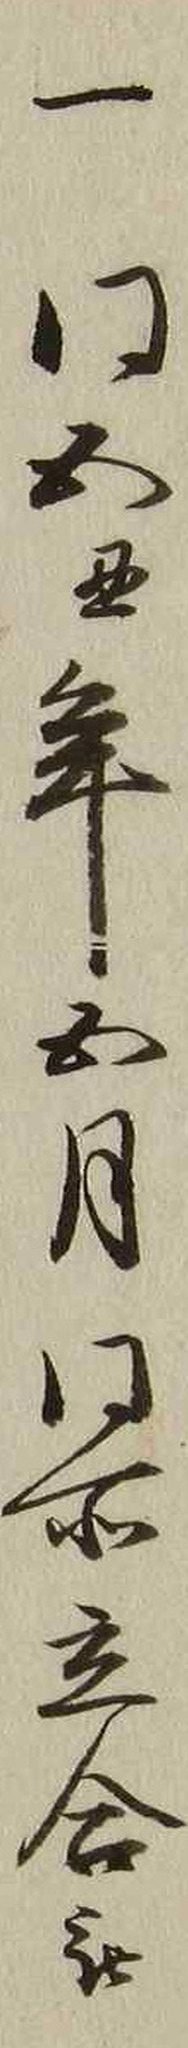一同五丑年五月同所立合被
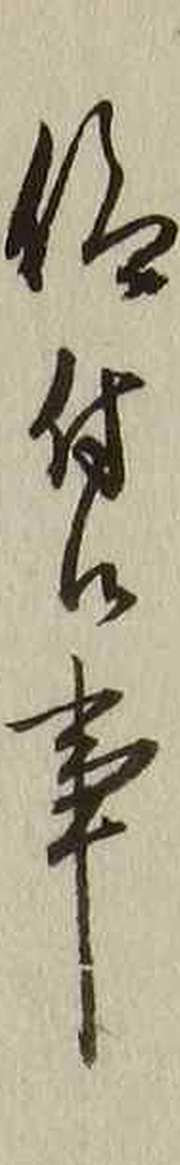仰付候事
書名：諸士系譜　巻之102　か之部10
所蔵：会津若松市立会津図書館
